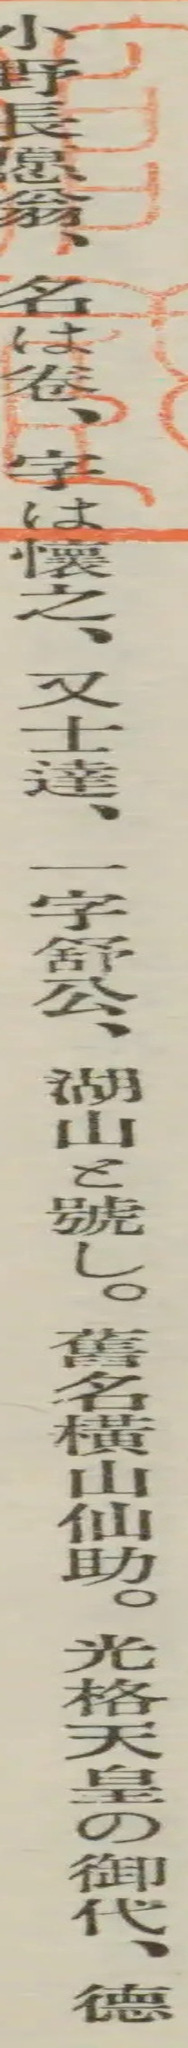小野長愿、名は巻、字は懐之、又士達、一字舒公、湖山と号し。旧名横山仙助。光格天皇の御代、徳
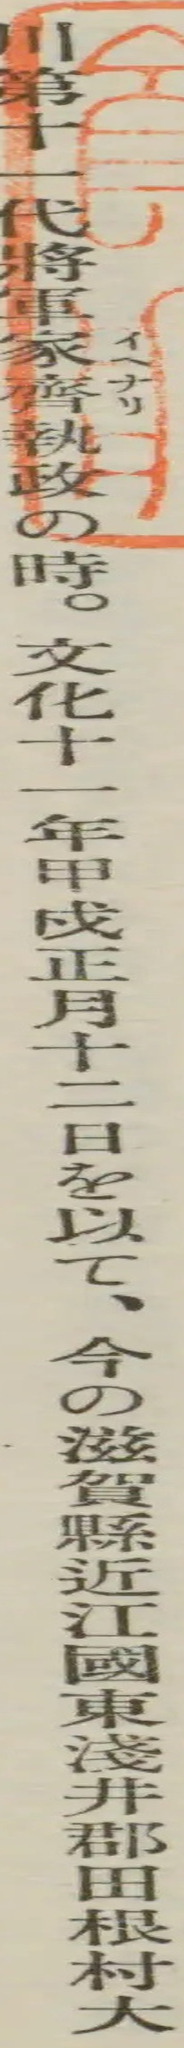川第十一代将軍家齊執政の時。文化十一年甲戌正月十二日を以て、今の滋賀県近江国東浅井郡田根村大
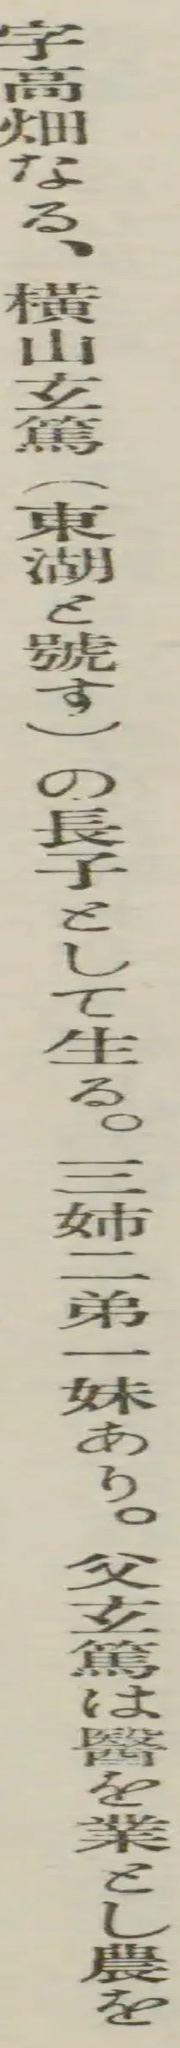字高畑なる、横山玄篤(東湖と号す)の長子として生る。三姉二弟一妹あり。父玄篤は医を業とし農を
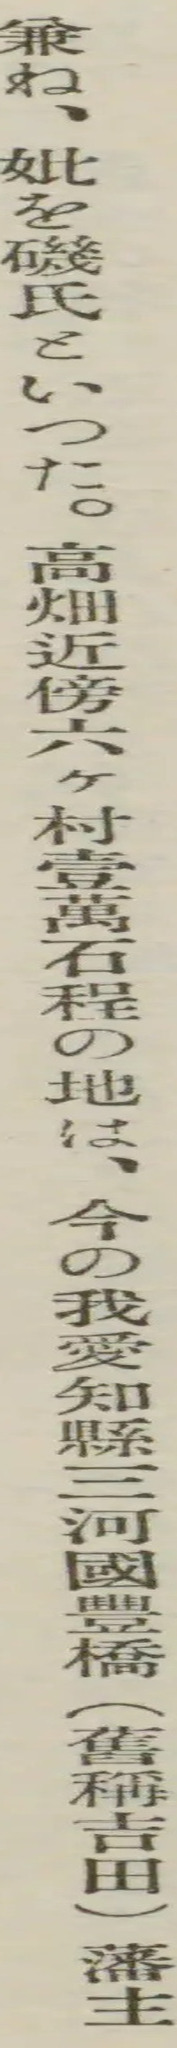兼ね、妣を磯氏といつた。高畑近傍六ケ村壱万石程の地は、今の我愛知県三河国豊橋(旧称吉田)藩主
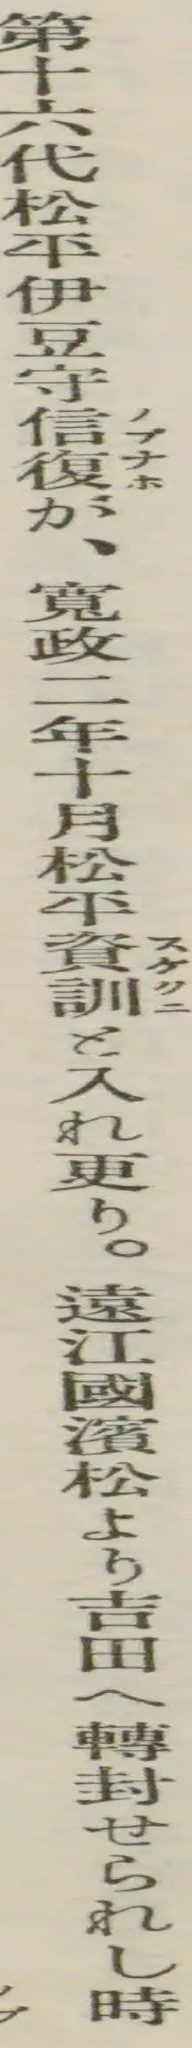第十六代松平伊豆守信復が、寛政二年十月松平資訓と入れ更り。遠江国浜松町より吉田へ転封せられし時
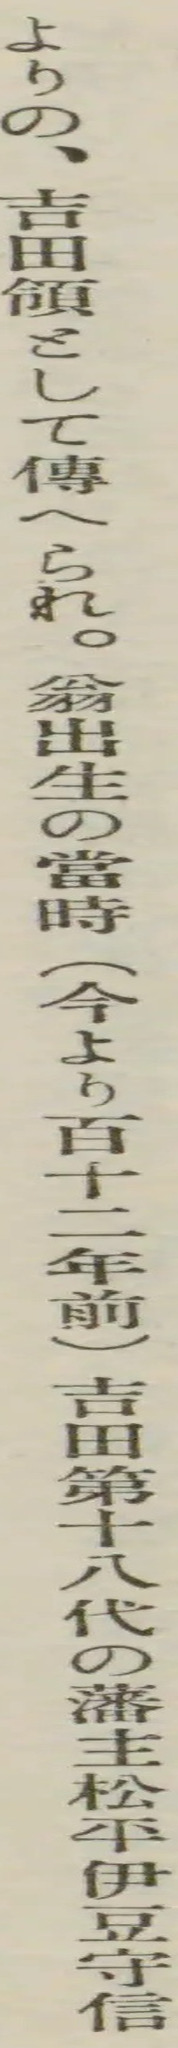よりの、吉田領として伝へられ。翁出生の当時(今より百十二年前)吉田第十八代の藩主松平伊豆守信
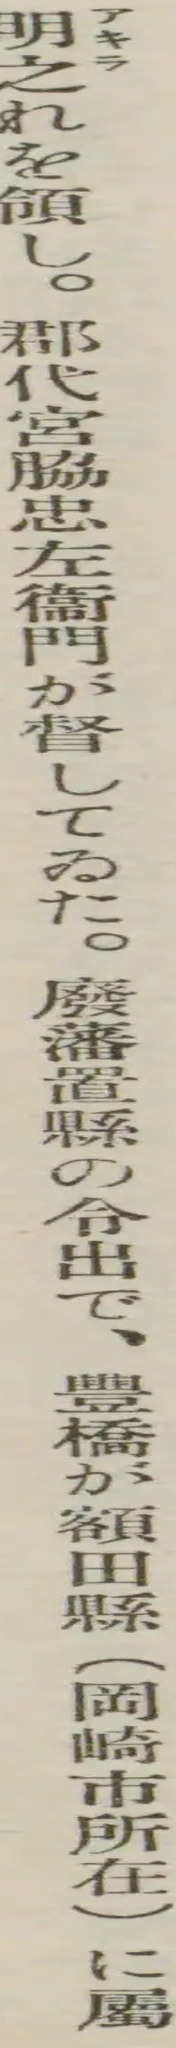明之れを領し。郡代宮脇忠左衛門が督してゐた。廃藩置県の令出で、豊橋が額田県(岡崎市所在)に属
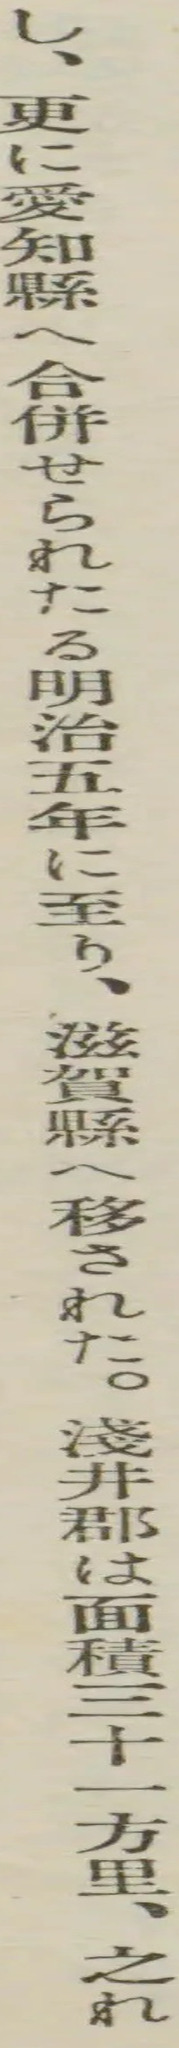し、更に愛知県へ合併せられたる明治五年に至り、滋賀県へ移された。浅井郡は面積三十一方里、之れ
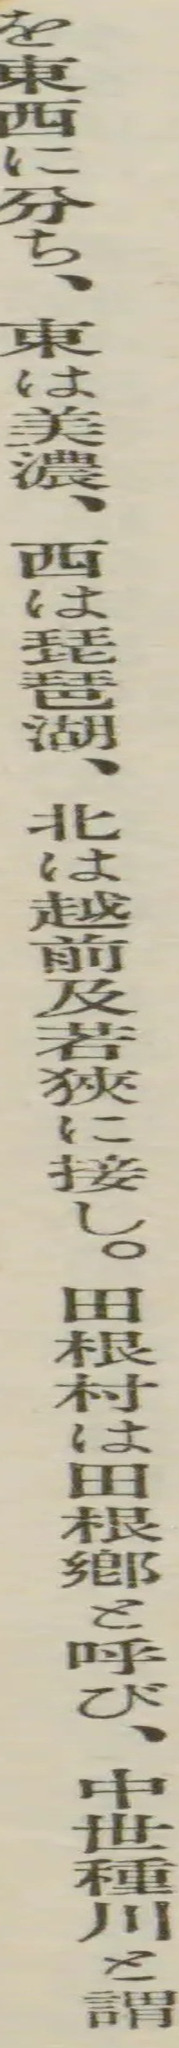を東西に分ち、東は美濃、西は琵琶湖、北は越前及若狭に接し。田根村は田根郷と呼び、中世種川と謂
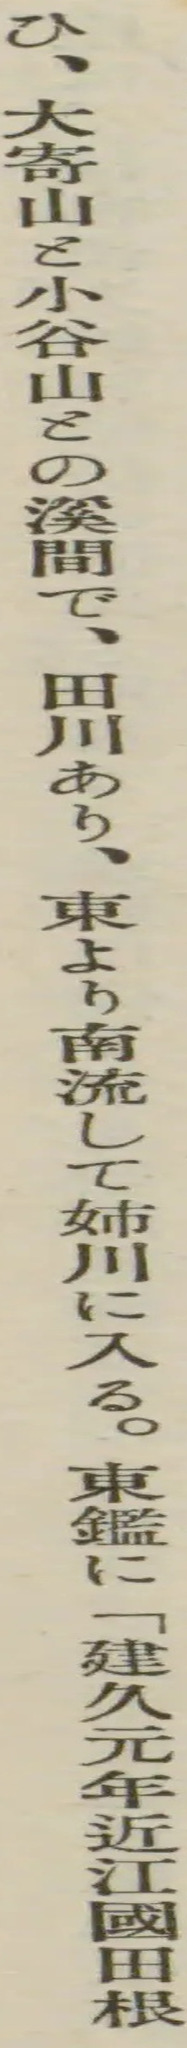ひ、大寄山と小谷山との渓間で、田川あり、東より南流して姉川に入る。東鑑に「建久元年近江国田根

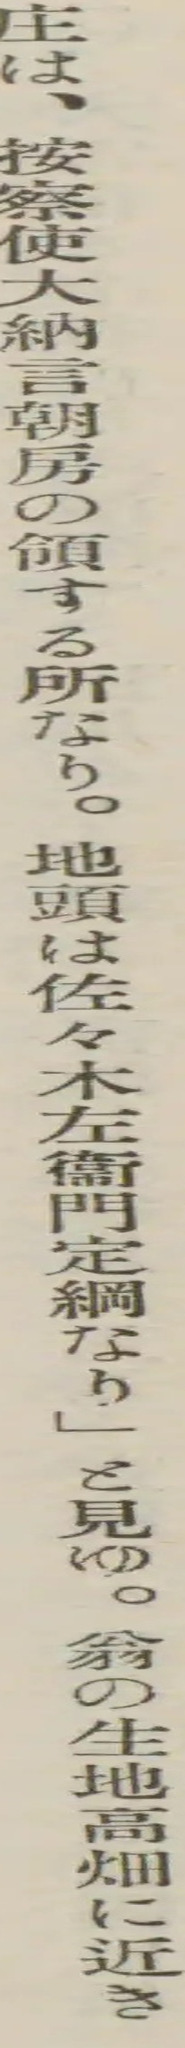庄は、按察使大納言朝房の領する所なり。地頭は佐々木左衛門定綱なり」と見ゆ。翁の生地高畑に近き
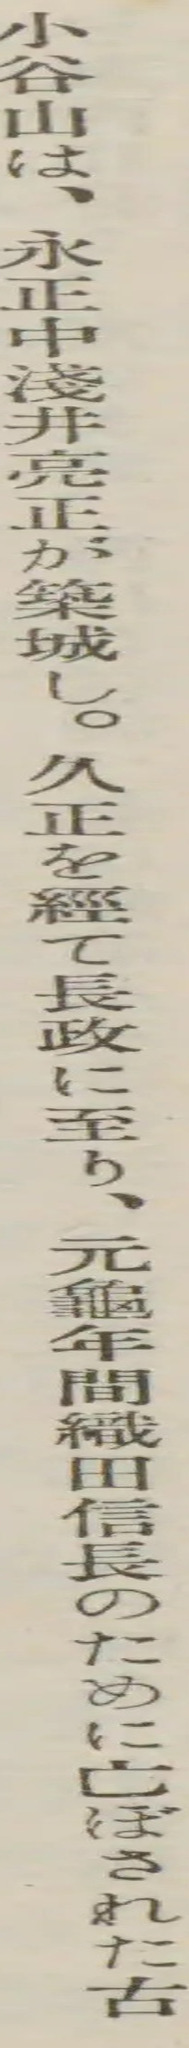小谷山は、永正中浅井亮正が築城し。久正を経て長政に至り、元亀年間織田信長のために亡ぼされた古
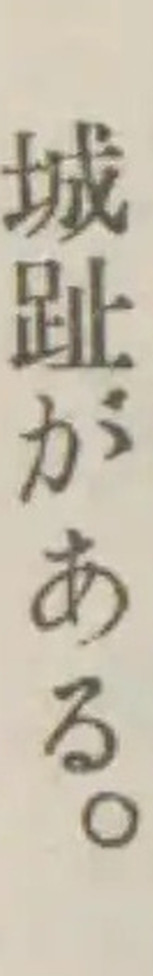城趾がある。
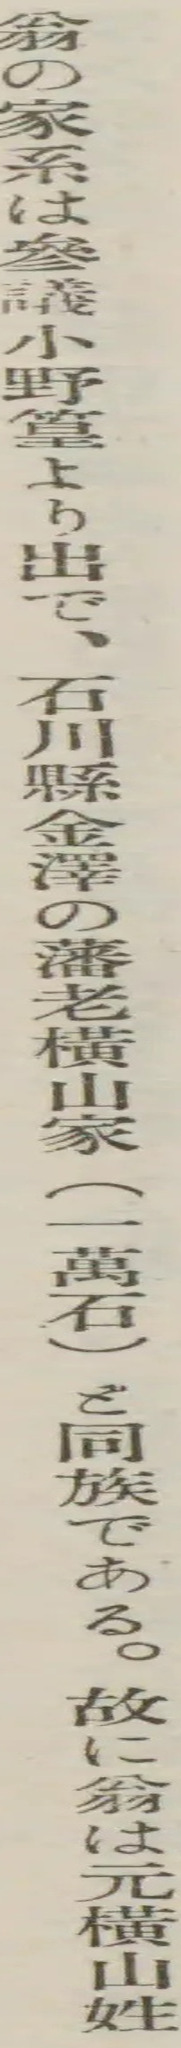翁の家系は参議小野篁より出で、石川県金沢の藩老横山家(一万石)と同族である。故に翁は元横山姓
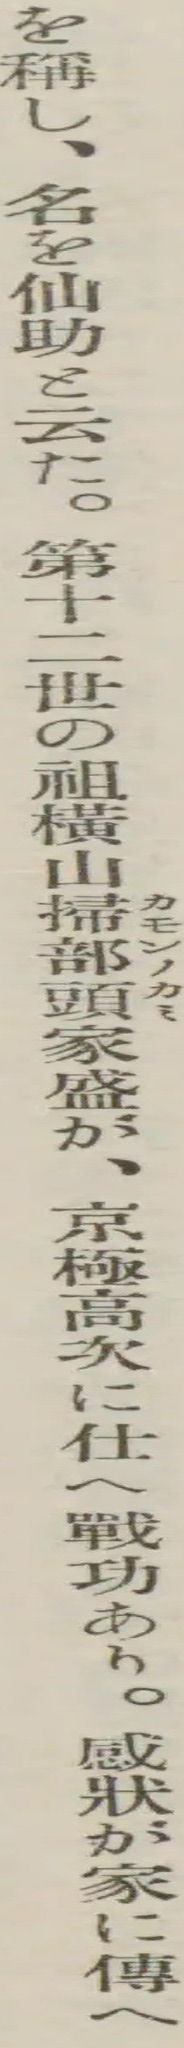を称し、名を仙助と云た。第十二世の祖横山掃部頭家盛が、京極高次に仕へ戦功あり。感状が家に伝へ
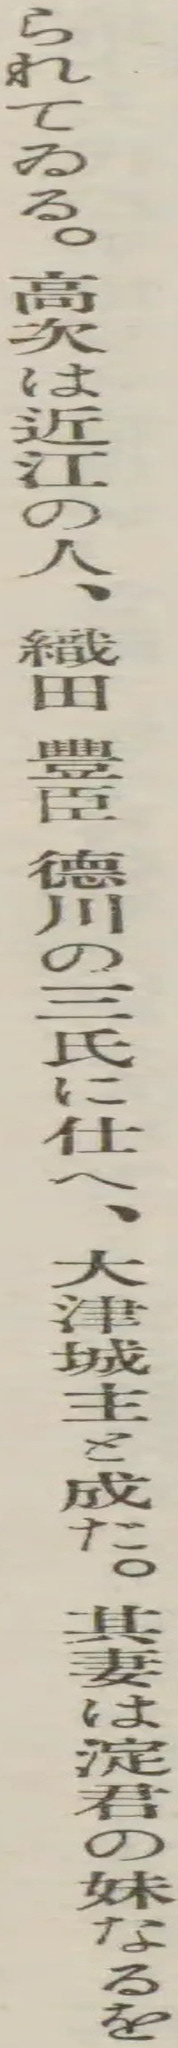られてゐる。高次は近江の人、織田豊臣徳川の三氏に仕へ、大津城主と成た。其妻は淀君の妹なるを
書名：小野湖山翁小伝
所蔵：国立国会図書館 National Diet Library, JAPAN
